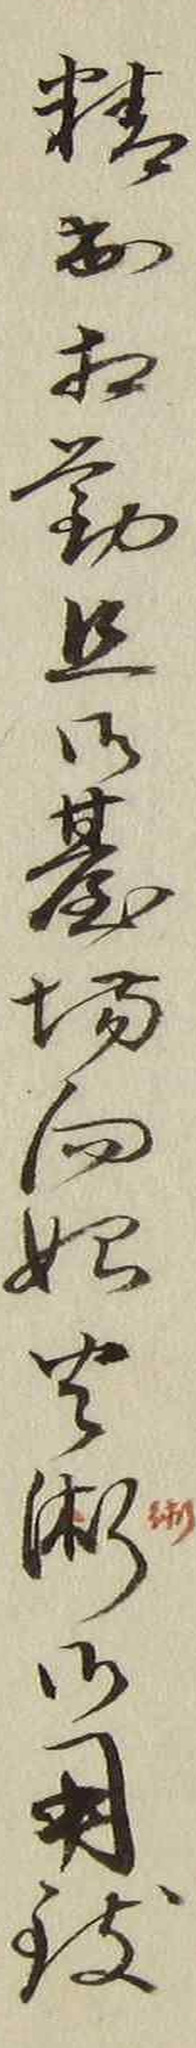精出相勤旦御台場向始火術御用致
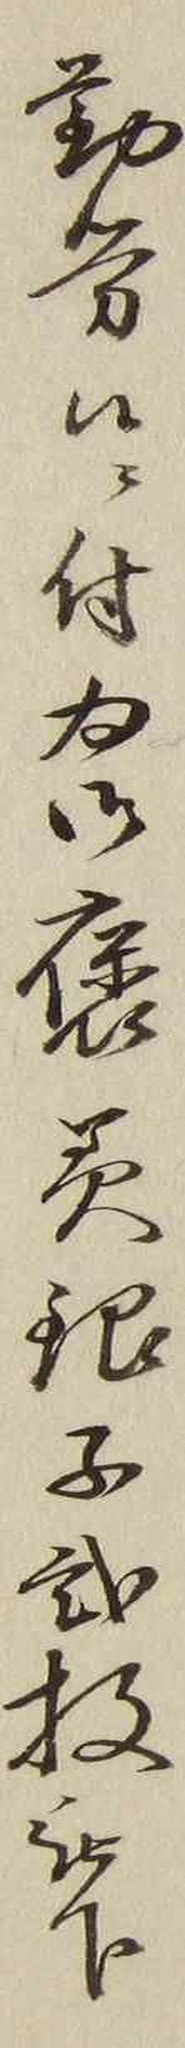勤労候ニ付為御褒美銀子弐枚被下
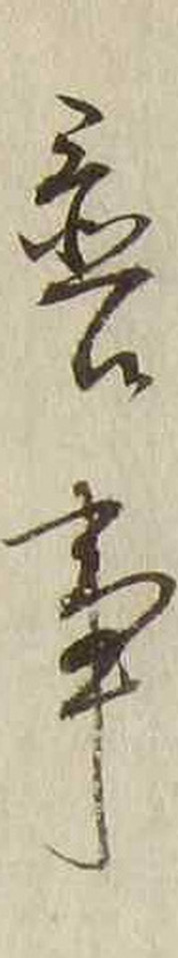置候事

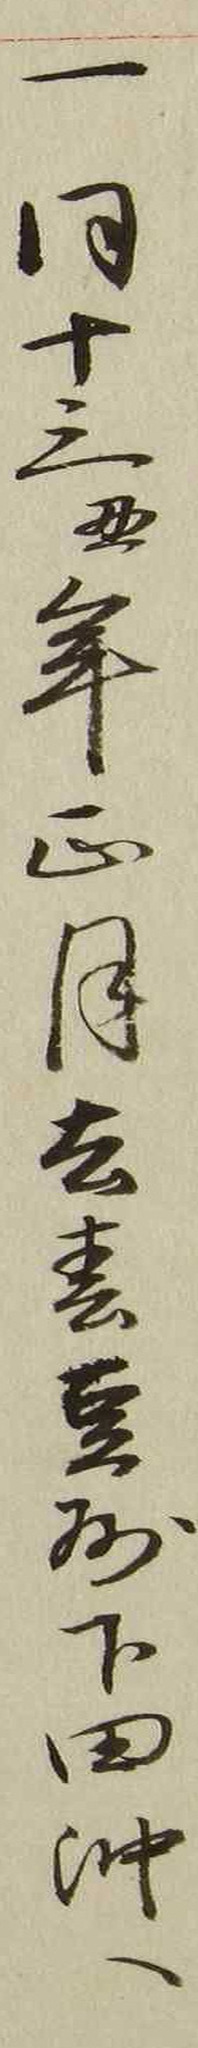一同十三丑年正月去春豆州下田沖へ
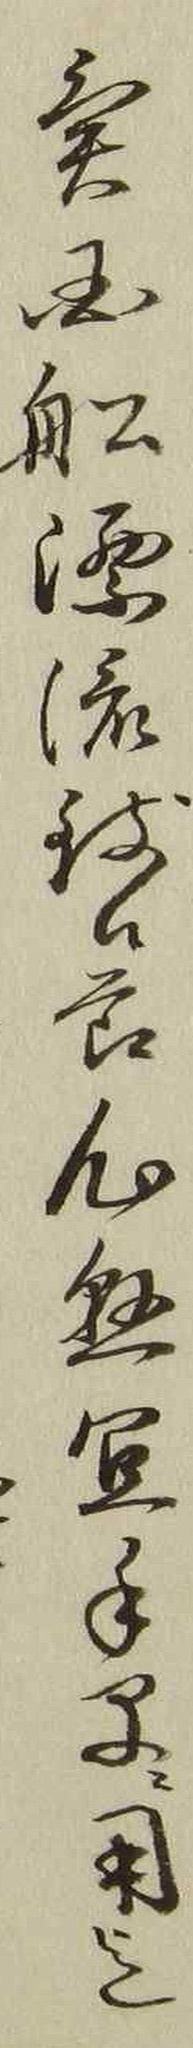異国舩漂流致候節心懸宜手早ニ用迄
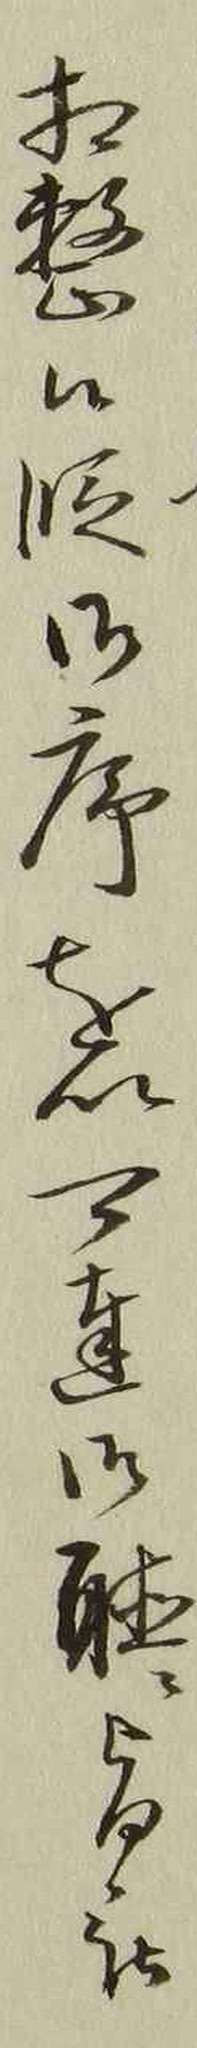相整候段御序を以可達御聴ニ旨被
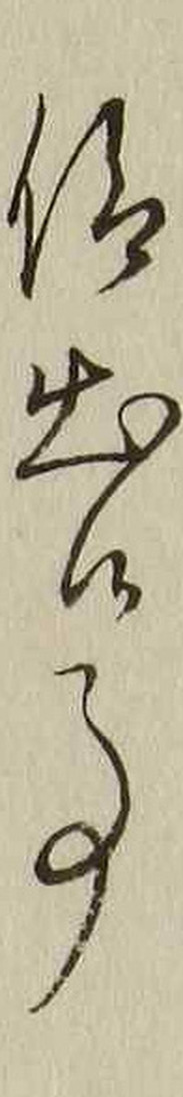仰出候事
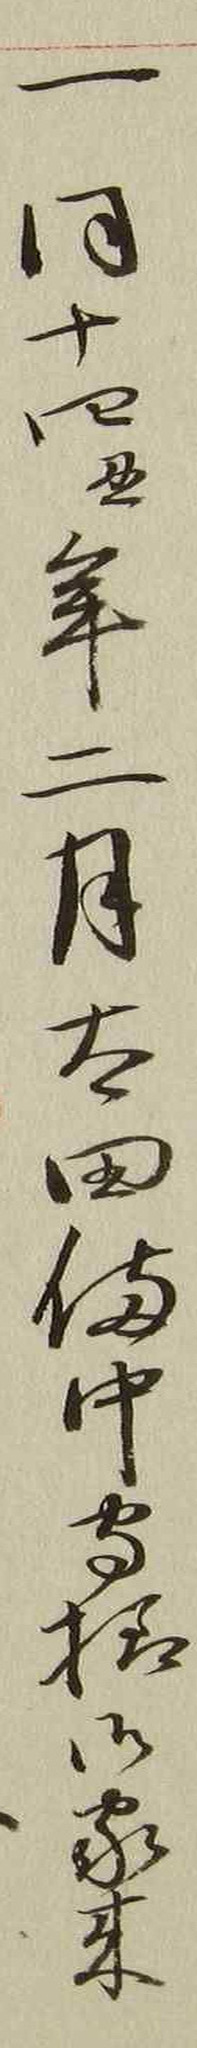一同十四丑年二月太田備中守様御家来
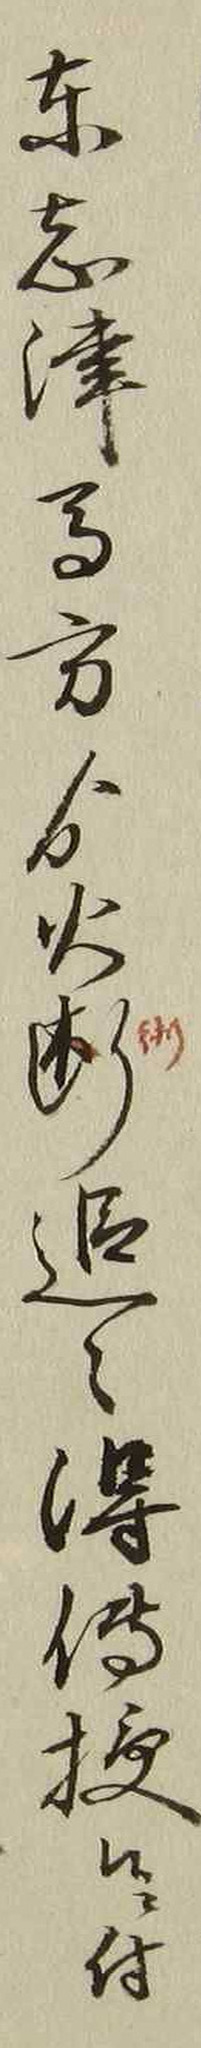東志津馬方ゟ火術追々得伝授候ニ付
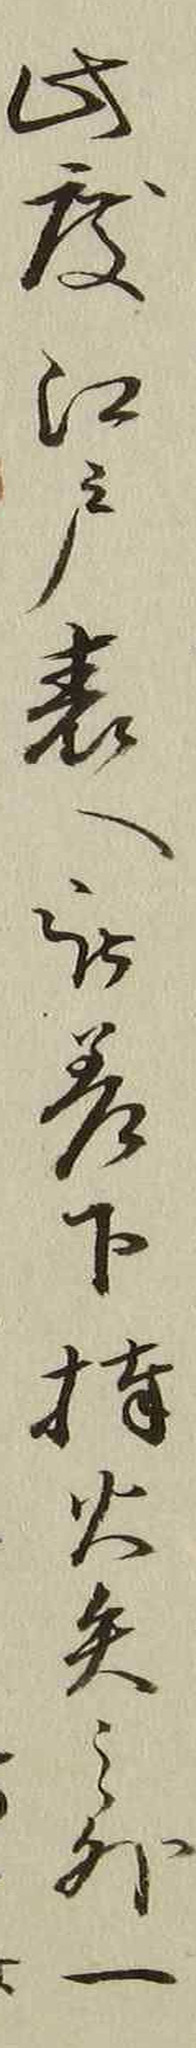此度江戸表へ被差下棒火矢之外一
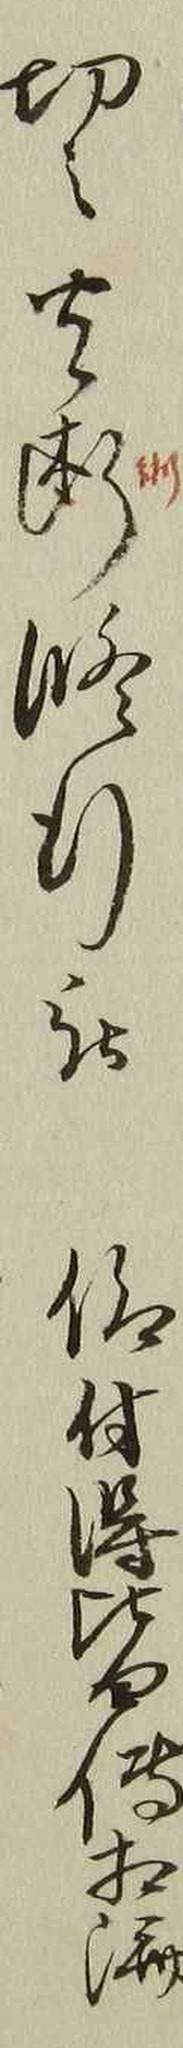切之火術修行被仰付得皆伝相済
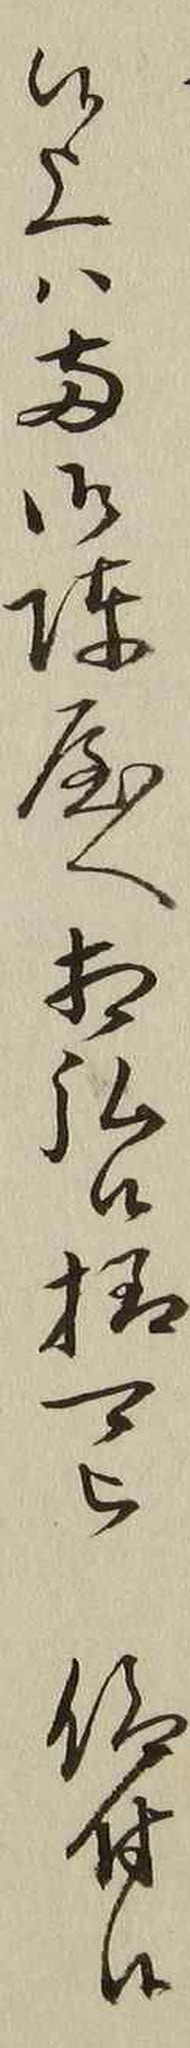候上ハ両御陳屋へ相弘候様可被仰付候
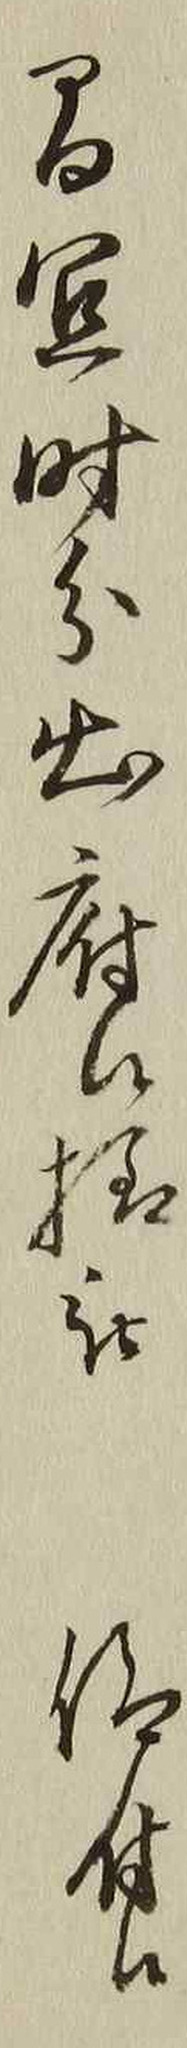間宜時分出府候様被仰付候
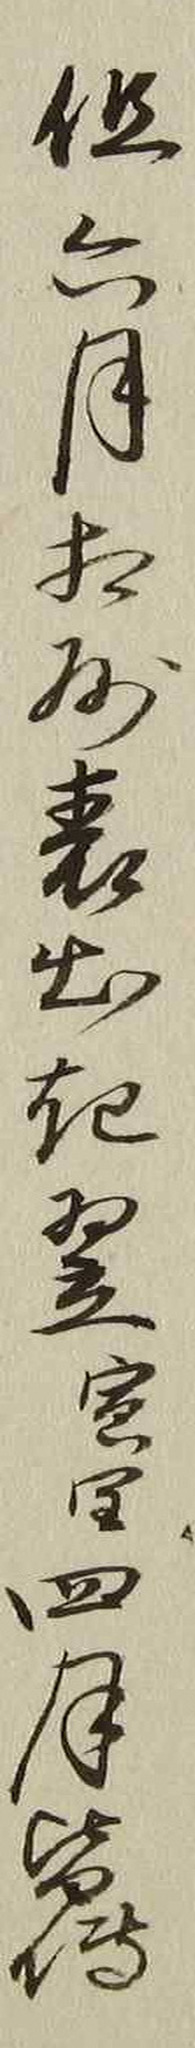但六月相州表出起翌寅閏四月皆伝
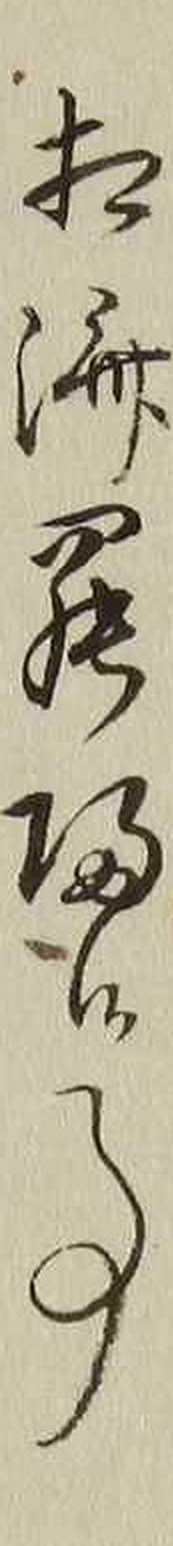相済罷帰候事
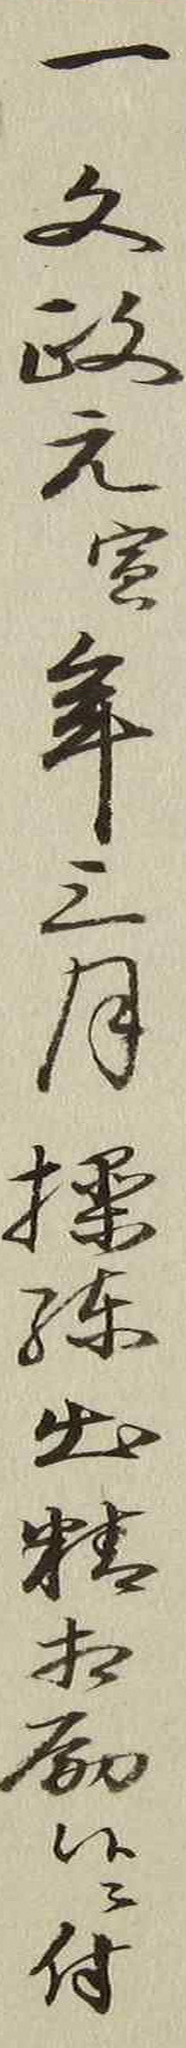一文政元寅年三月操練出精相励候ニ付
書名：諸士系譜　巻之114　か之部22
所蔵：会津若松市立会津図書館
